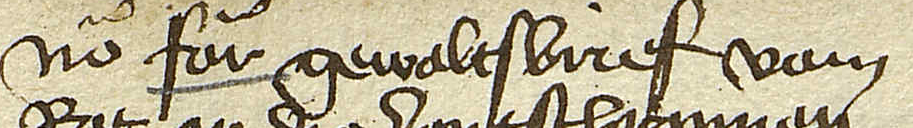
No* for* gewaltſbrief vom
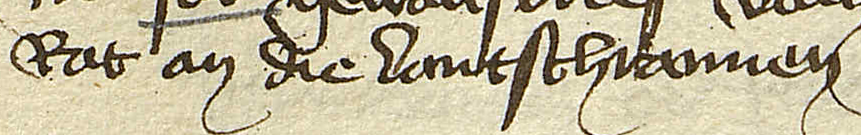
Rat an die lantſchrannen
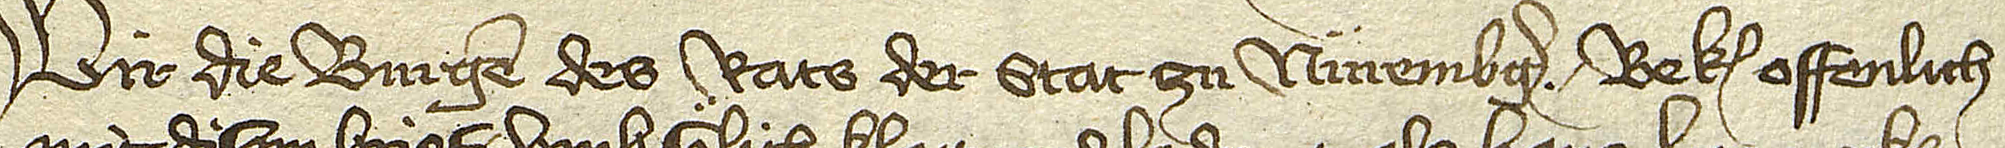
Wir die Burge* des Rats der Stat cʒu Nürembg* . / Bek* offenlich
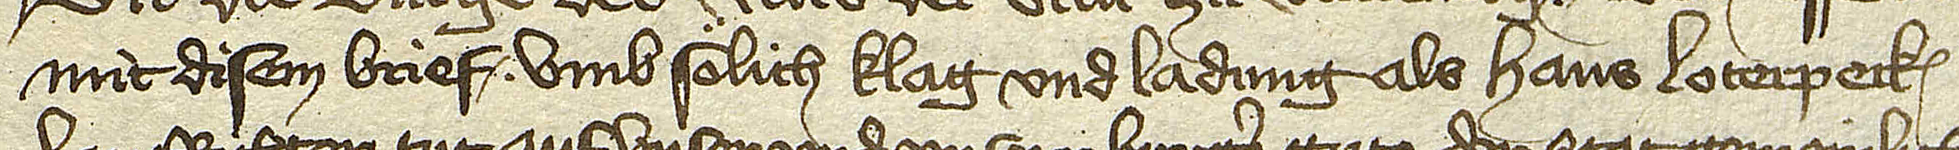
mit diſem brief / . Vmb ſölich klag vnd ladung als hans Loterpeck*
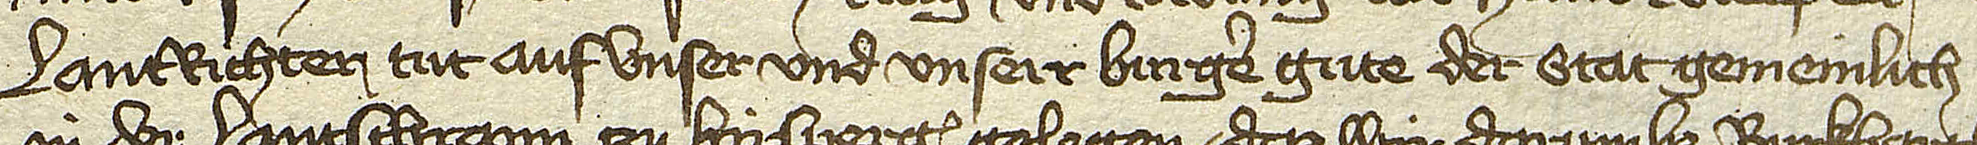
LantRichter tut auf vnſer vnd vnſerr burge* gute der Stat gemeinlich
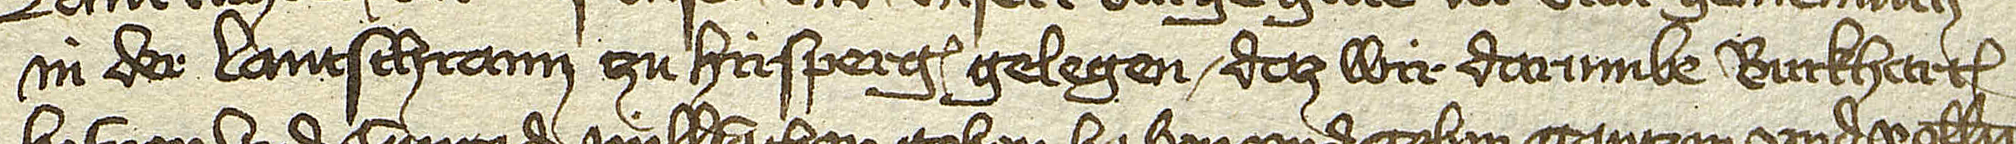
in der lantſchrann cʒu hirſperg* gelegen / daʒ wir darumbe Burkhart*
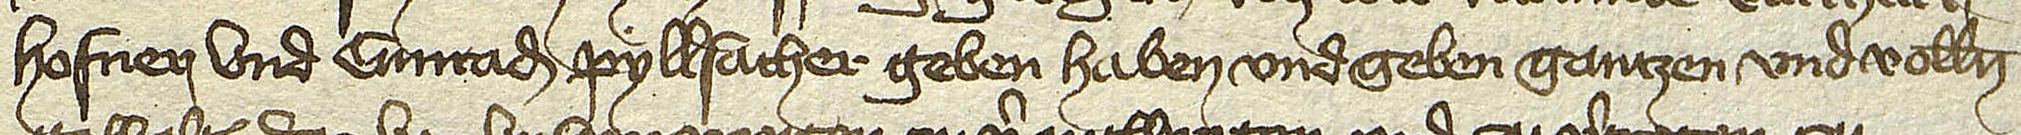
hofner vnd Cunrad* Pyllſacher geben haben vnd geben gancʒen vnd volln*
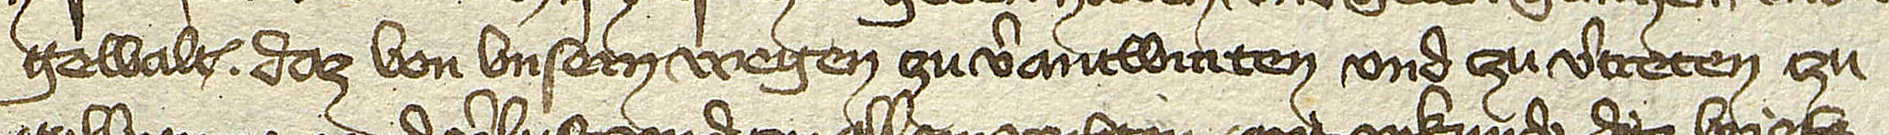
gewalt . daʒ von vnſern wegen cʒu v*antwurten vnd cʒu v*treten cʒu
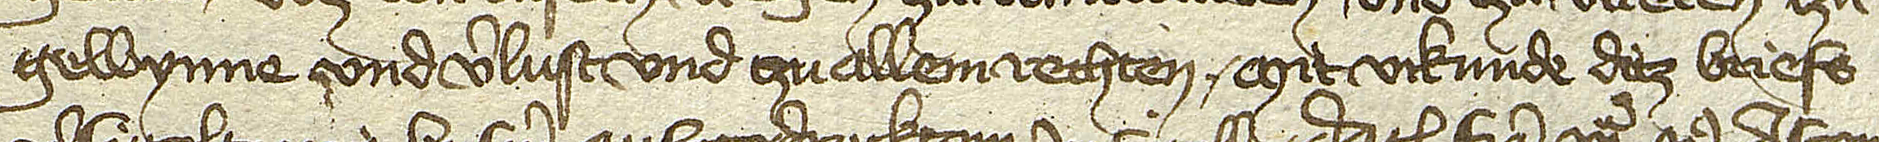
gewynne vnd v*luſt vnd cʒu allem rechten . / Mit vrkunde dicʒ briefs
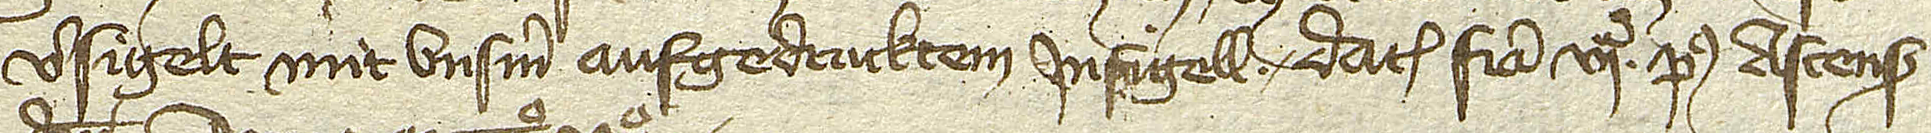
v*ſigelt mit vnſm* aufgedruckten Inſigell . / Dat* fia* vi* . p* Aſcenſ*
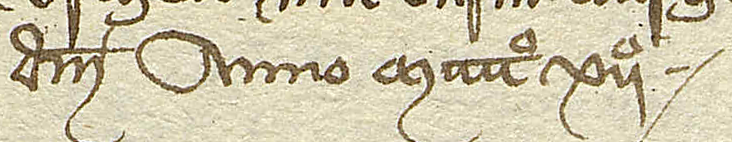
dm* Anno Mcccc* xii* - /
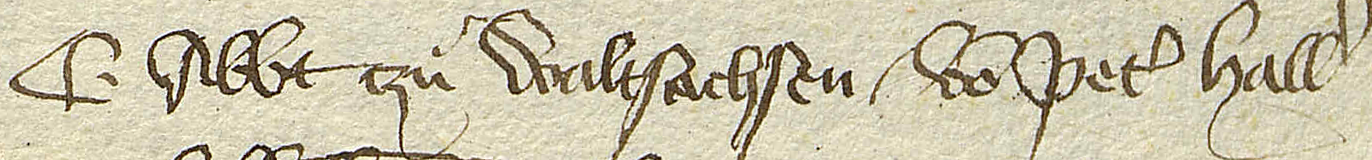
C . Abbt cʒü Waltſachſen / vo* Pet* hall*
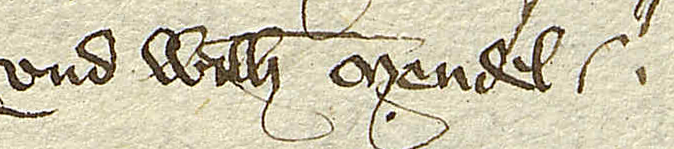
vnd wilh* Mendel / .
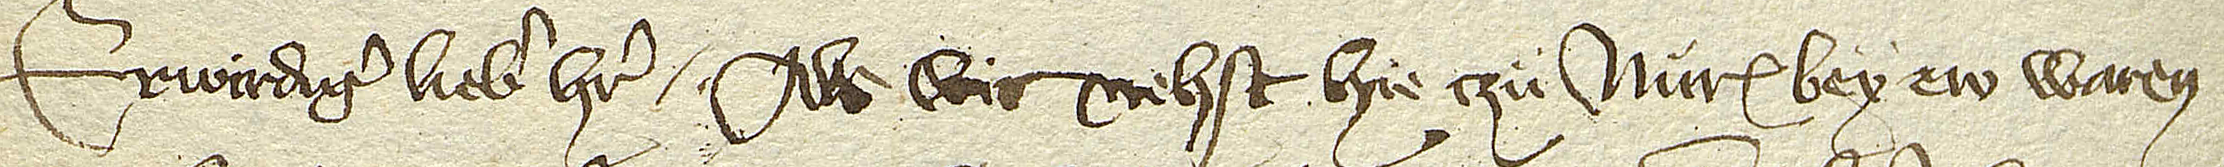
Erwirdig* lieb* hr* / Als wir nehſt hie cʒü Nür* bey ew waren
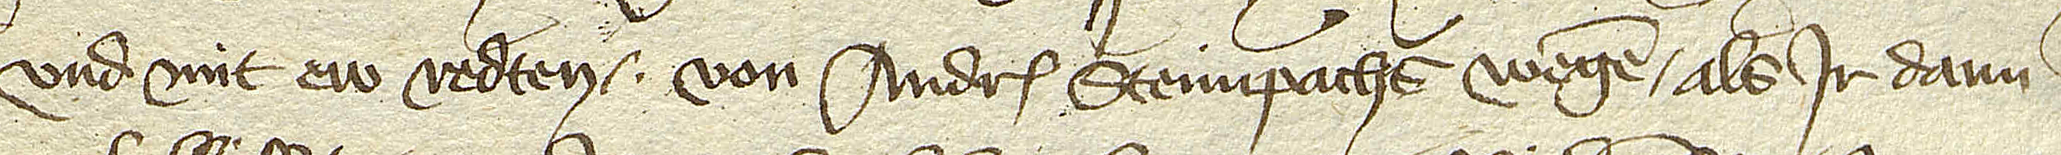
vnd mit ew redten / . von Andr* Steimpachs wege* / als Ir dann
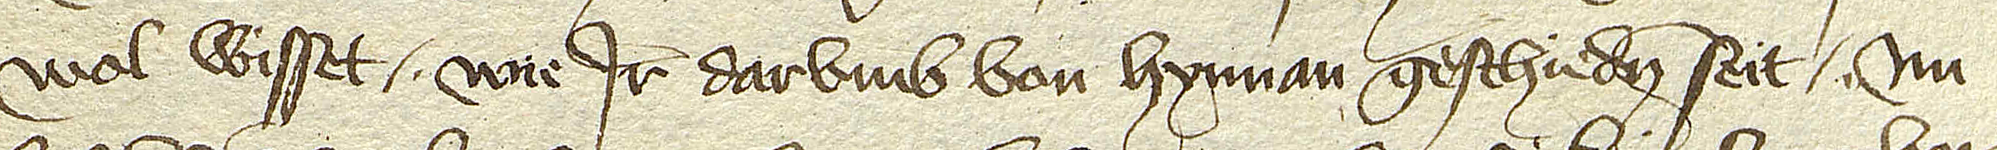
wol wiſſet / . wie Ir darvmb von hynnan geſchiedn* ſeit / . Nu
